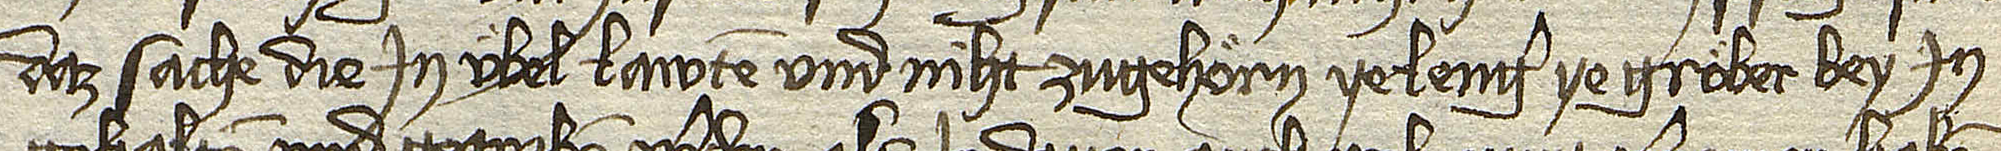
daʒ ſache die In v̈bel lawte* vnd niht ʒugehörn ye leng* ye gröber bey In
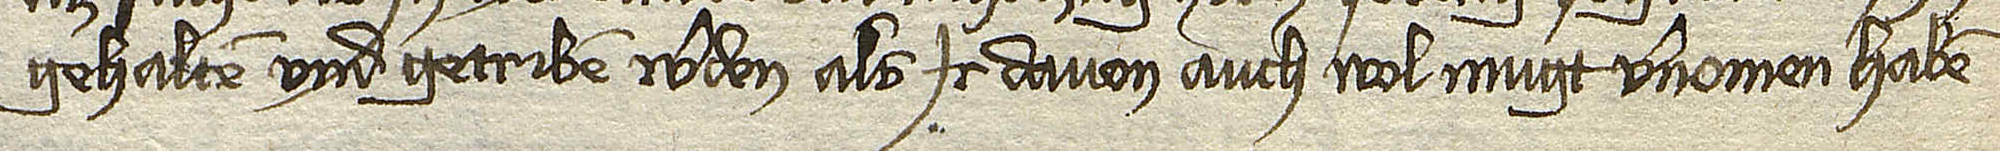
gehalte* vnd getribe* w*den als Ir dauon auch wol mugt v*nomen habe*
